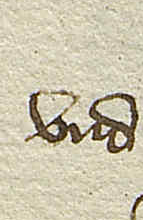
vnd
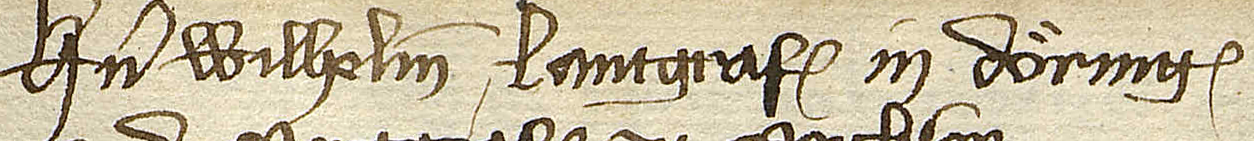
Hn* Wilhelm* lantgraf* in Döring*
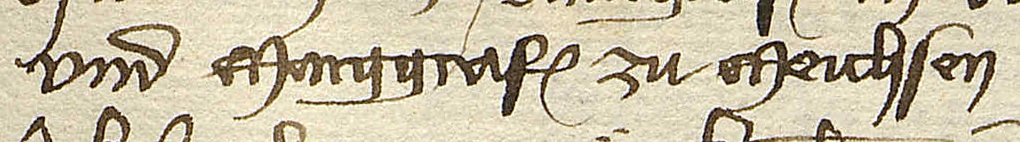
vnd Marggraf* ʒu Meichſen
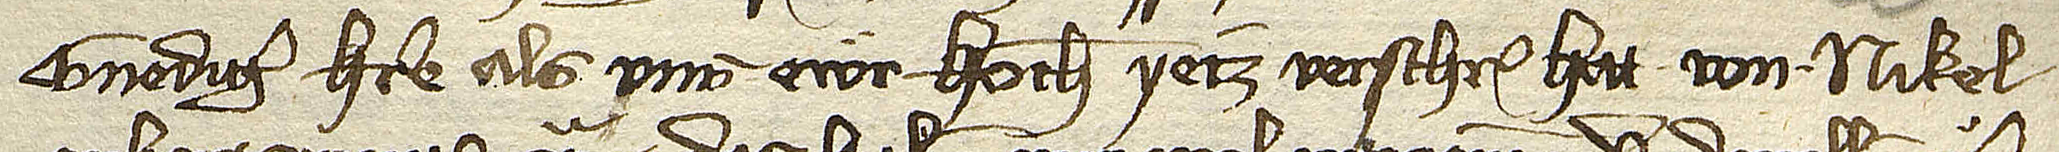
Gnedig* h*re als vns eẅr hoch* yecʒ* verſchr* hat . von . Nikel
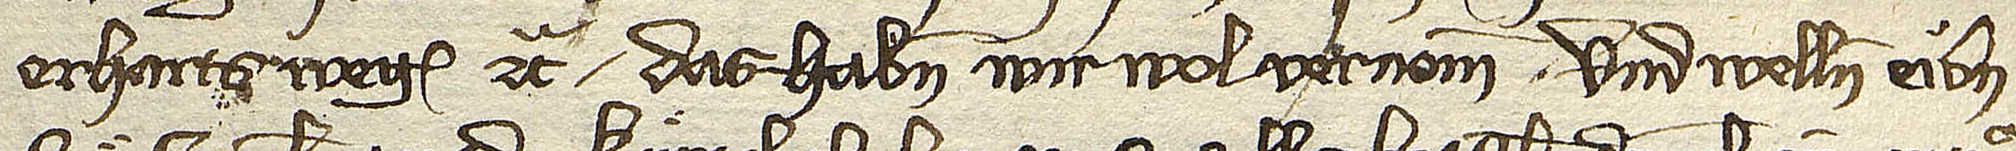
erharts weg* ec* / das habn* wir wol vernom* / Vnd welln* eẅ*n
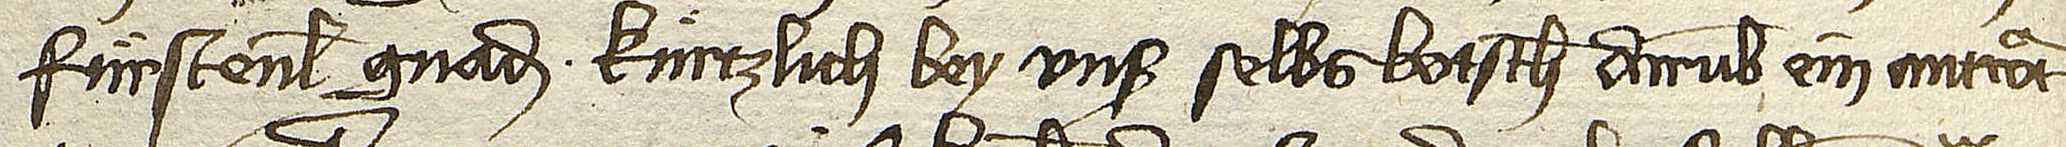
fürſtenl* gnad* . kürcʒlich bey vnſ* ſelbs botſch* darub* ein antw*t
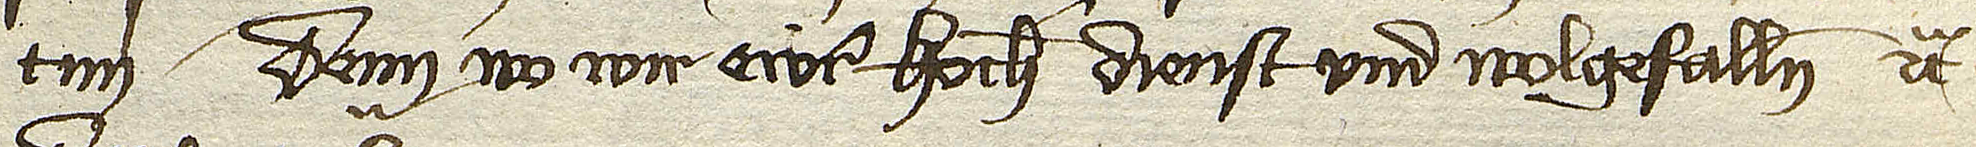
tun / Denn wo wir eẅr* hoch* dienſt vnd wolgefalln* ec*
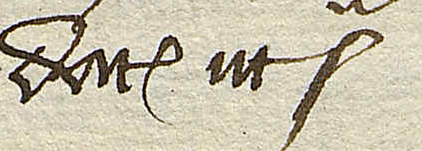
Dat* ut ſ*
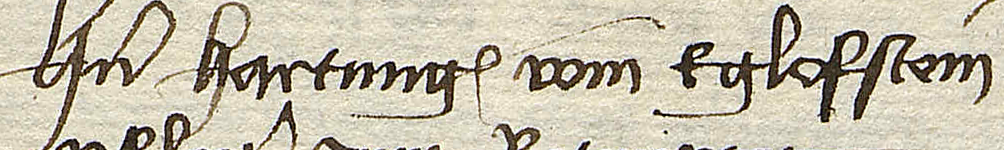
Hn* hartung* vom* Eglofſtein
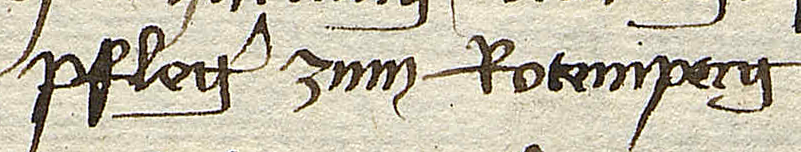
pfleg* ʒum Rotemperg
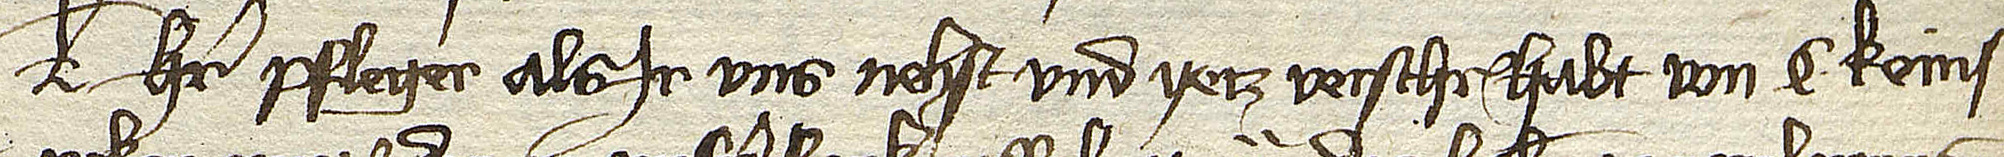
L* hr* pfleger als Ir vns nehſt vnd yecʒ verſchr* habt von C . keinſ
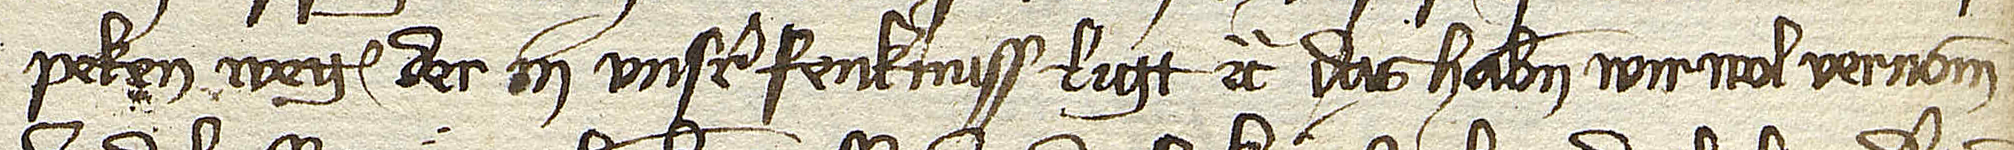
peken weg* der in vnſr* fenknuſſ ligt ec* das habn* wir wol vernom*
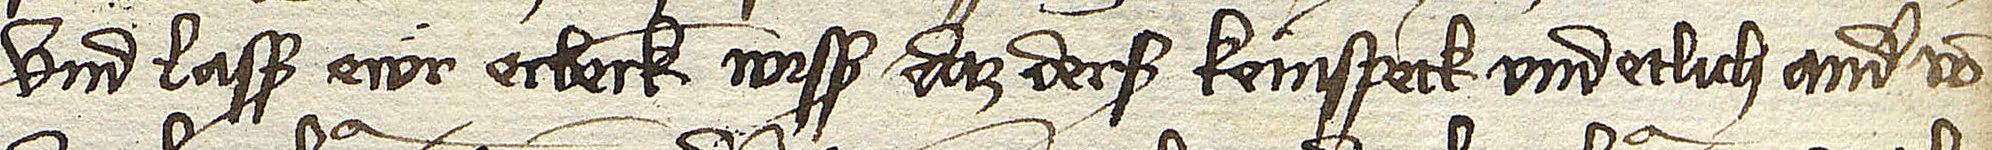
Vnd laſſ* eẅr erberk* wiſſ* / daʒ derſ* keinſpeck vnd etlich and* vo*
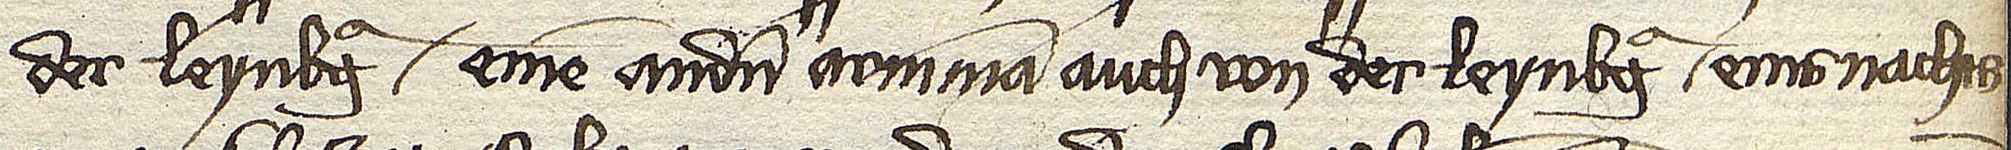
der leynb*g / eine* andn* armma* auch von der leynb*g / eins nachts
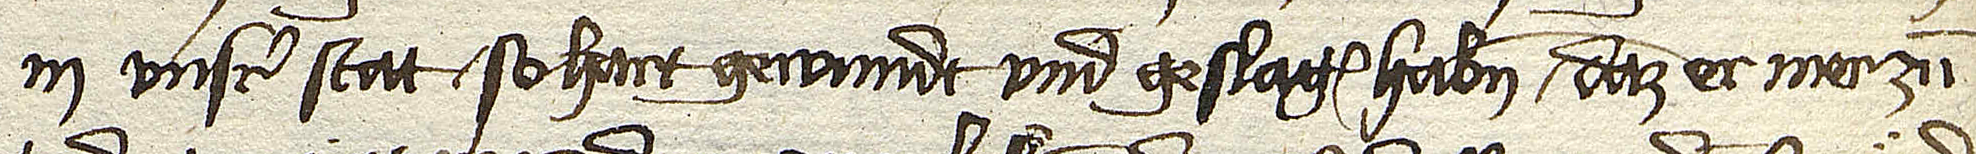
in vnſr* ſtat / ſo hart gewundt vnd geſlag* habn* / daʒ er mer ʒu*
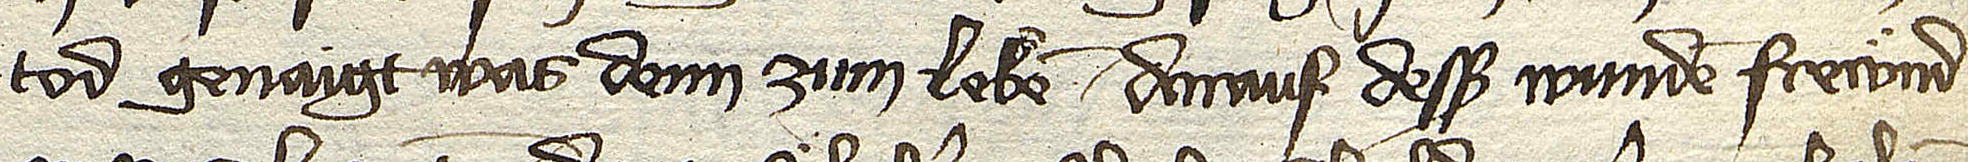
tod genaigt was denn ʒum lebe* / Darauf deſſ* wunde* freẅnd
